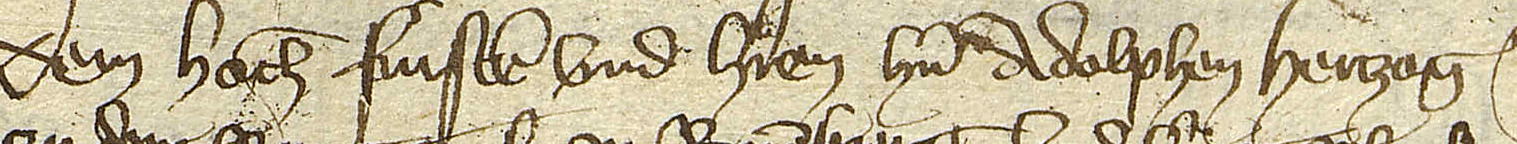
dem hoch* fürſte* vnd h*ren hn* Adolphen hercʒog
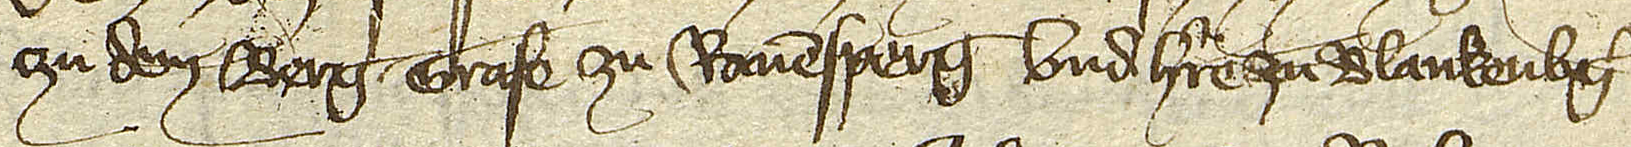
cʒu dem Berg / Grafe cʒu Raue*ſperg vnd h*re cʒu Blankenbg*
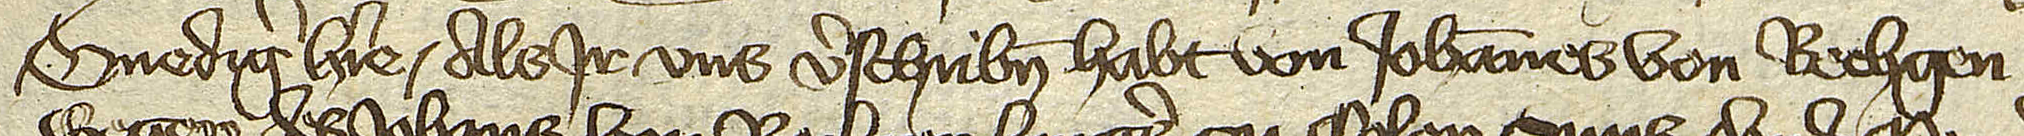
Gnedig* hr*e / Als Ir vns v*ſchribn* habt von Iohan*es von Bechgen
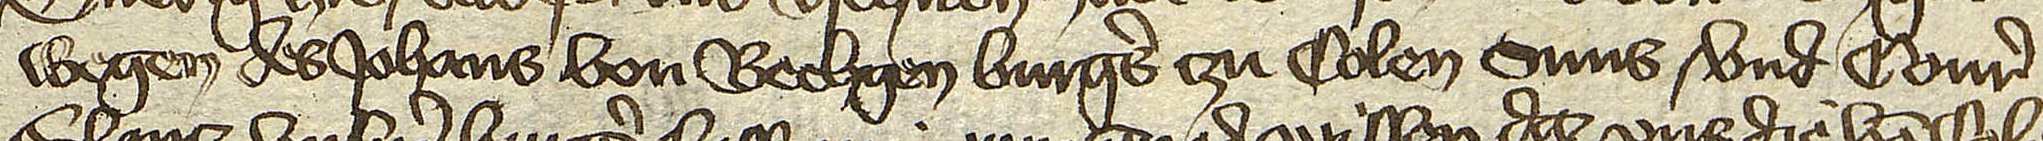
wegen des Iohans von Bechgen burgs* cʒu Colen Suns / vnd Conr*
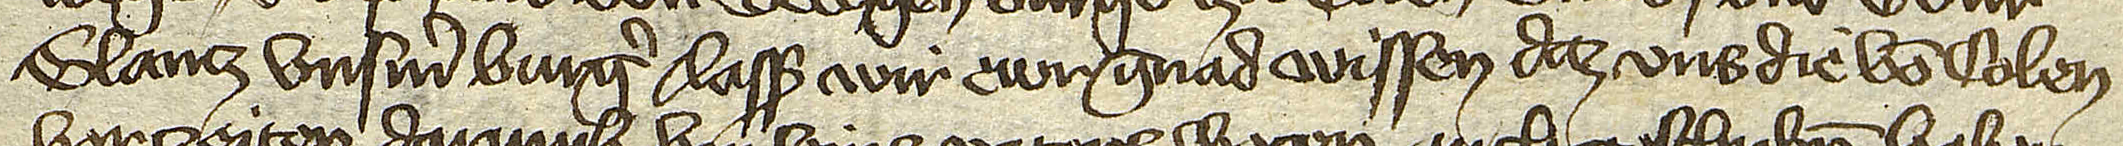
Glancʒ vnſm* burg* laſſ* wir ewr gnad wiſſen daʒ vns die vo* Colen
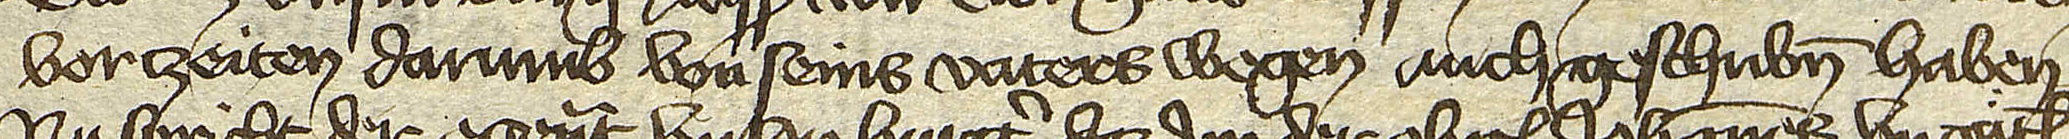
vor cʒeiten darumb von ſeins vaters wegen auch geſchribn* haben
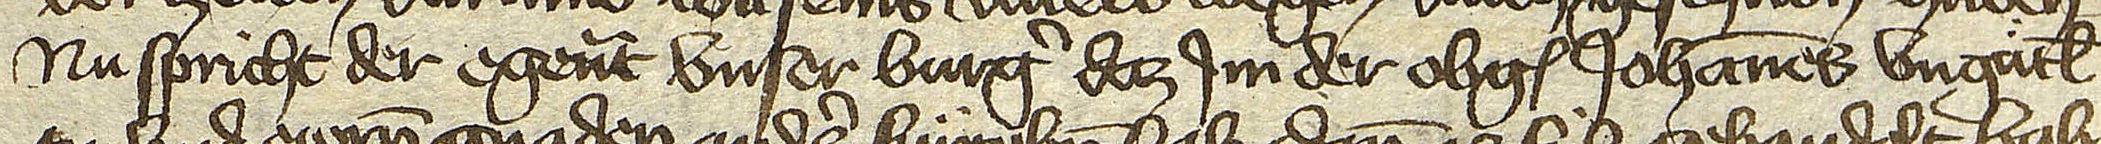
Nu ſpricht der egent* vnſer burg* daʒ Im der obg* Iohanes vngütl*
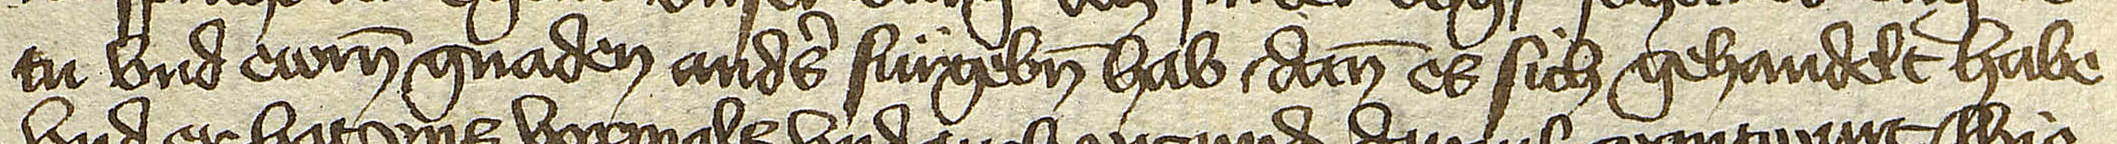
tu vnd ewrn* gnaden ands* fürgebn* hab / dan* es ſich gehandelt habe
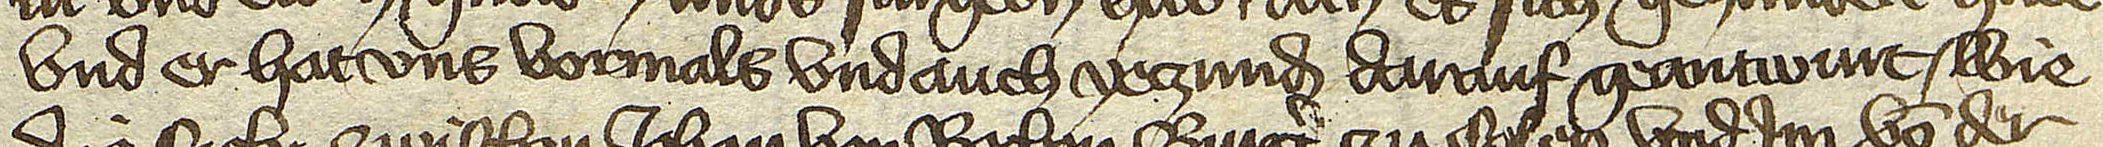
vnd er hat vns vormals vnd auch yecʒund* darauf geantwurt / wie
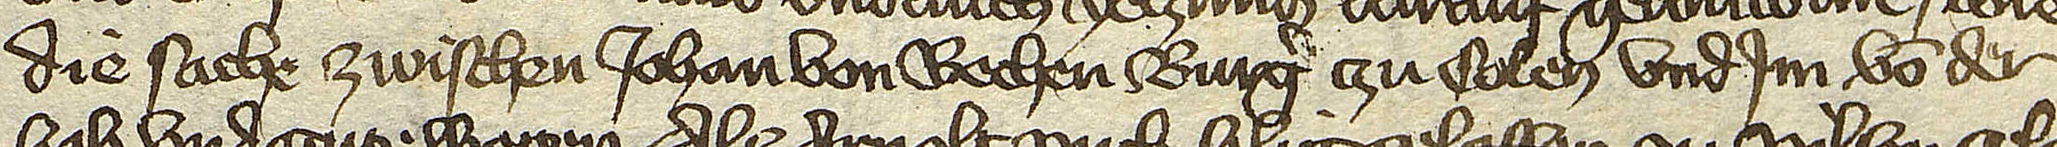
die ſache cʒwiſchen Iohan von Bechen Burg* cʒu Colen vnd Im vo* der
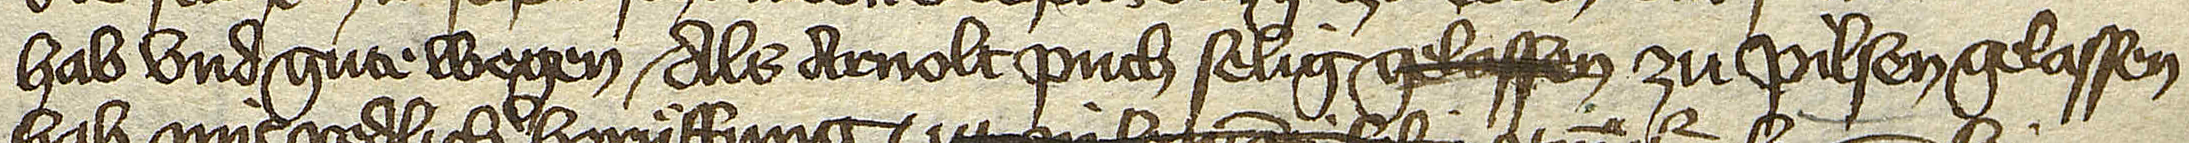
hab vnd gute wegen / Als Arnolt puch ſelig gelaſſen cʒu Pilſen gelaſſen
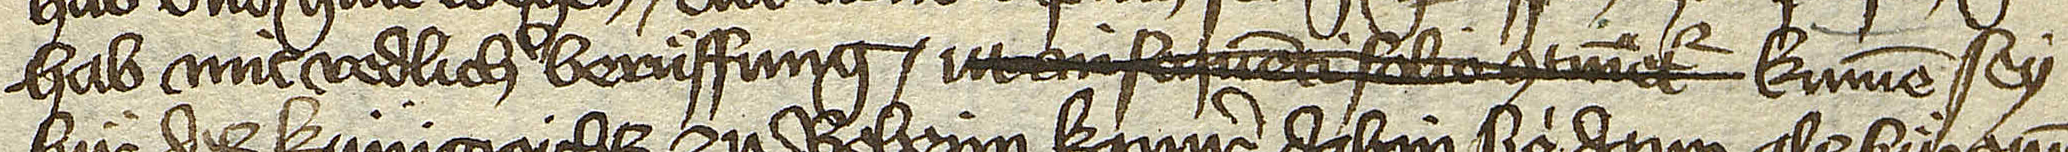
hab mit redlich* berüffung / ut in ſequeti* folio *tinet* kume* ſey
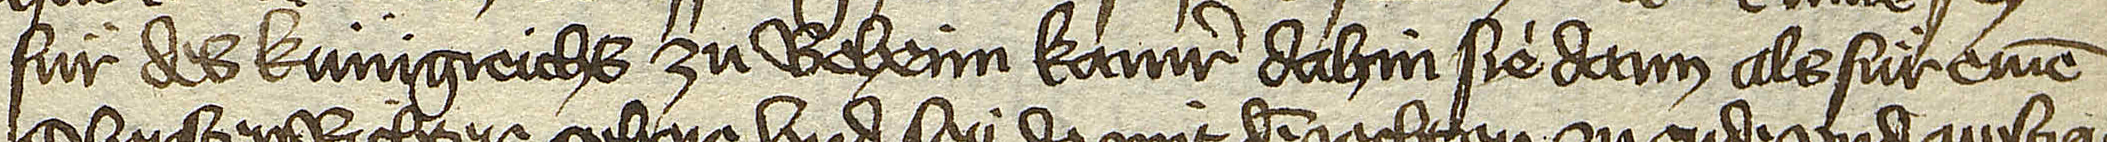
für des künigreichs cʒu Beheim kamr* dahin ſie dann als für eine*
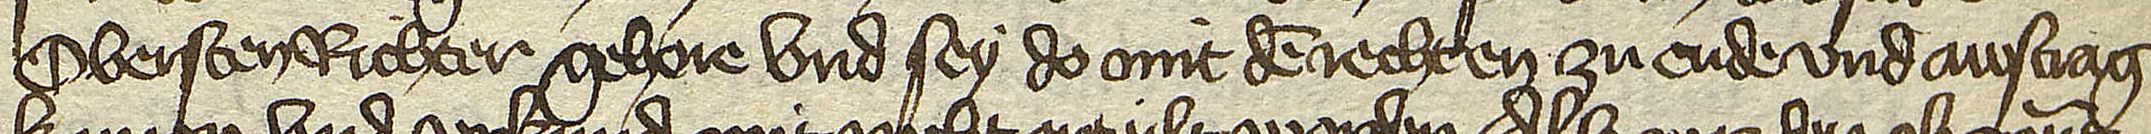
Oberſten Richter gehore vnd ſey do mit de* rechten cʒu ende vnd awſtrag
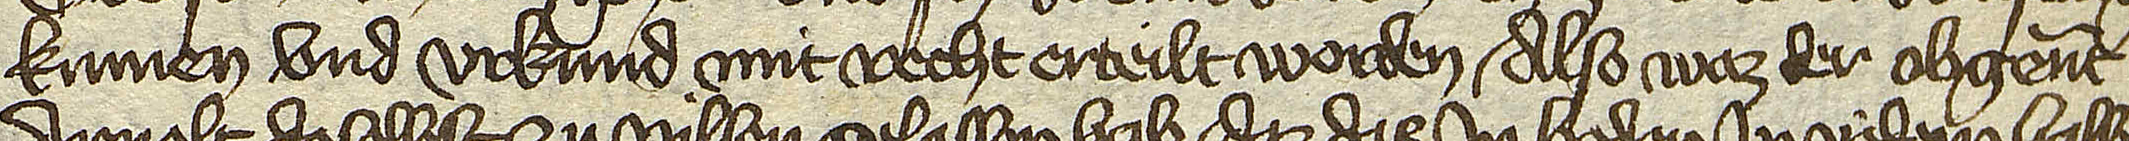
kumen vnd vrkunf mit recht erteilt worden / Alſo waʒ der obgent*
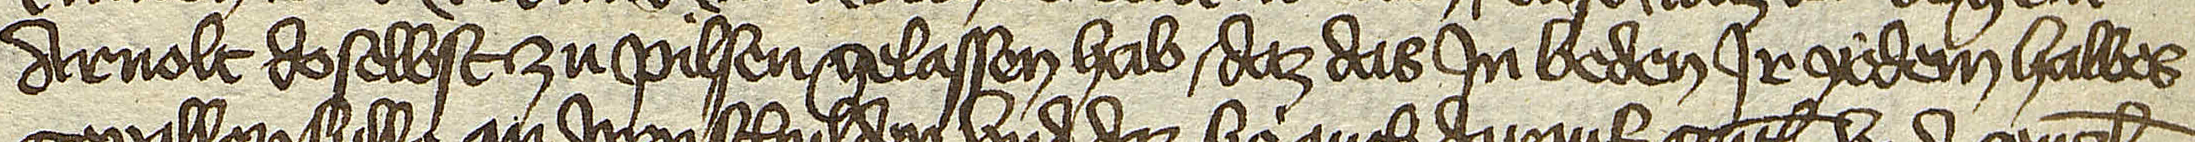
Arnolt doſelbſt cʒu Pilſen gelaſſen hab / daʒ das In beden Ir yedern halbes
